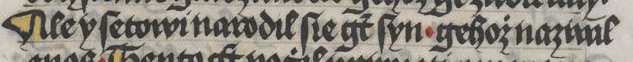Ale y ſetowi narodil ſie ḡt ſyn.gehoż nazwal
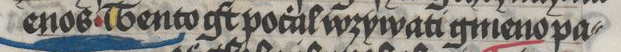enos.Tento ḡt poċal wzywatí gmeno pa:
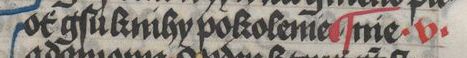oṫ gſu knihy pokoleníe níe .v.
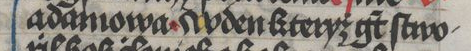adamowa. Wden kteryž ḡt ſtwo¬
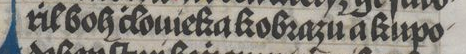ṙil boh ċlouieka k obrazu a kupo¬
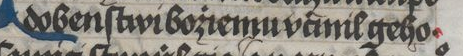dobenſtwí bożiemu vċiníl geho.
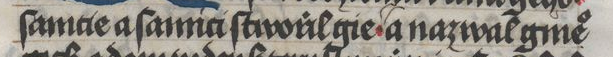ſamcíe a ſamici ſtwoṙil gie.a nazwal gmeo
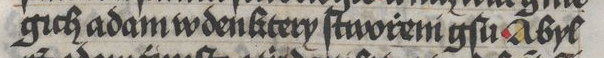gich adam w den ktery ſtwoṙení gſu. A byl
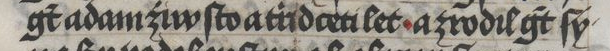ḡt adam żiw ſto a tṙidceti let. a zrodil ḡt ſy¬
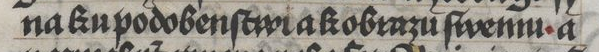na ku podobenſtwí a k obrazu ſwemu.a
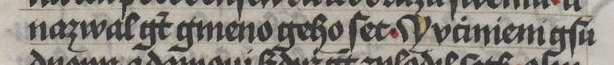nazwal ḡt gmeno geho ſet.Y vċinieni gſu
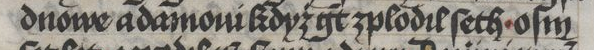dnowe adamoui kdyż ḡt zplodil ſeth. oſm
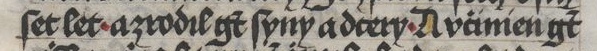ſet let.a zrodil ḡt ſyny a dcery.A vċíníen ḡt
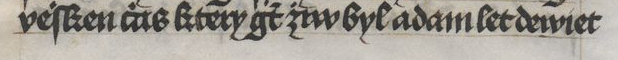veẛken ċas ktery ḡt żíw byl adam let dewiet
